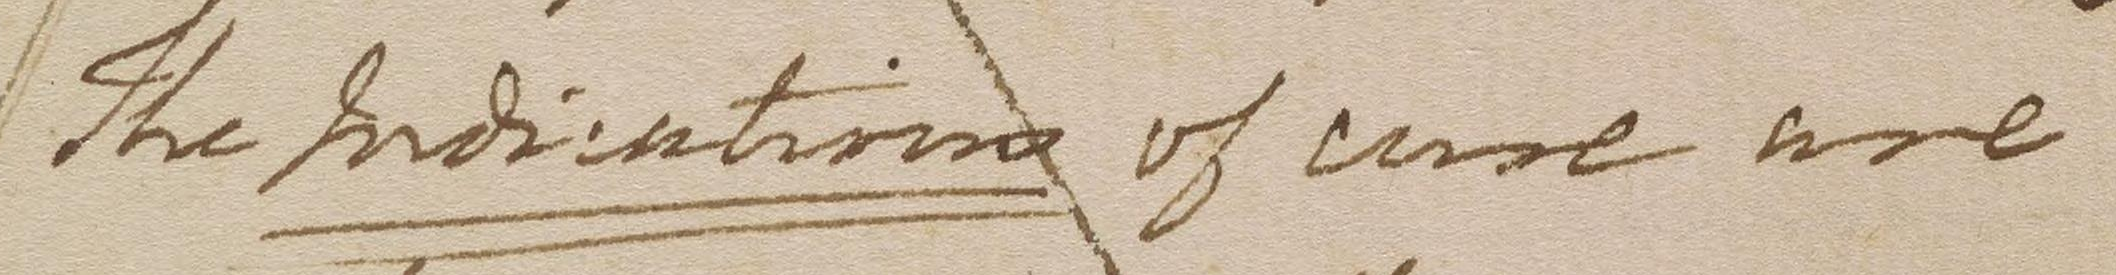The Indiciations of cause are
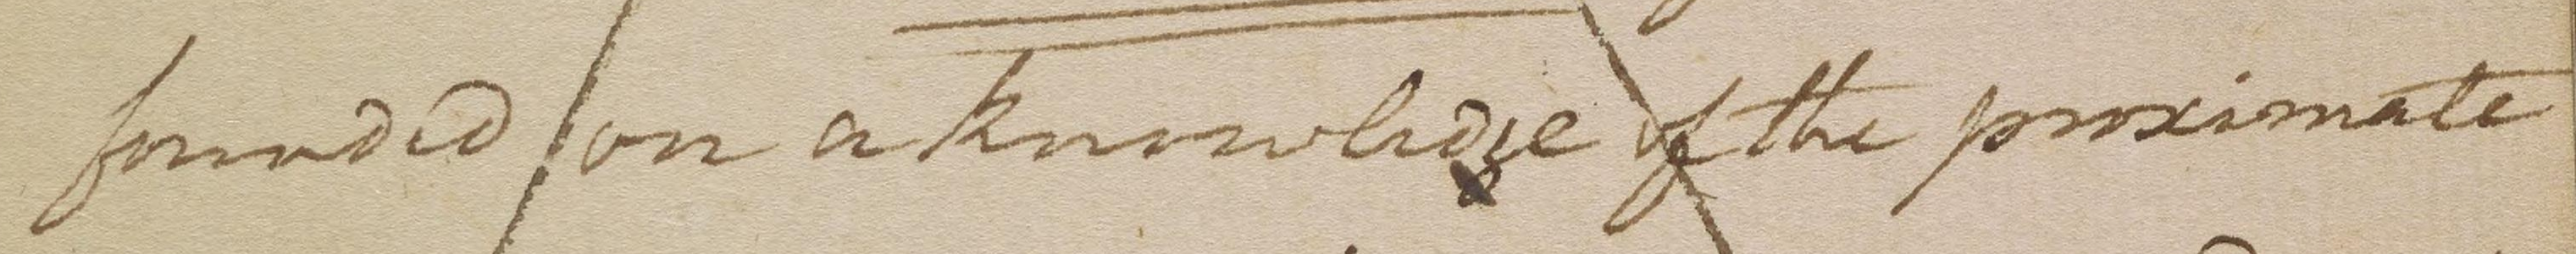founded on a knowledge of the proximate
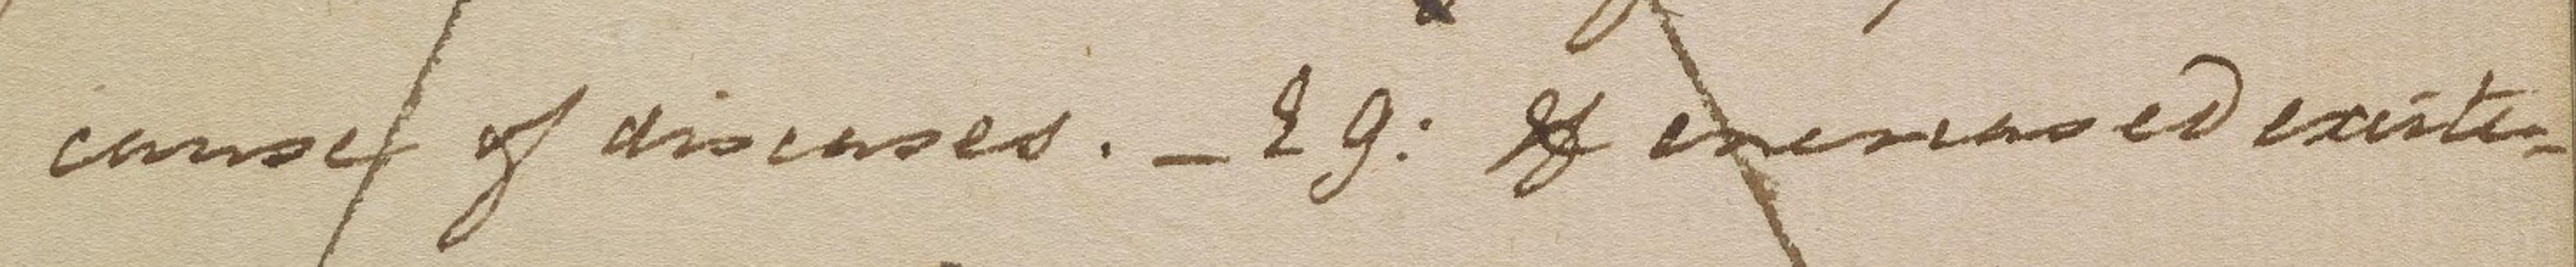cause of diseases.- E.g: If encreased excite-
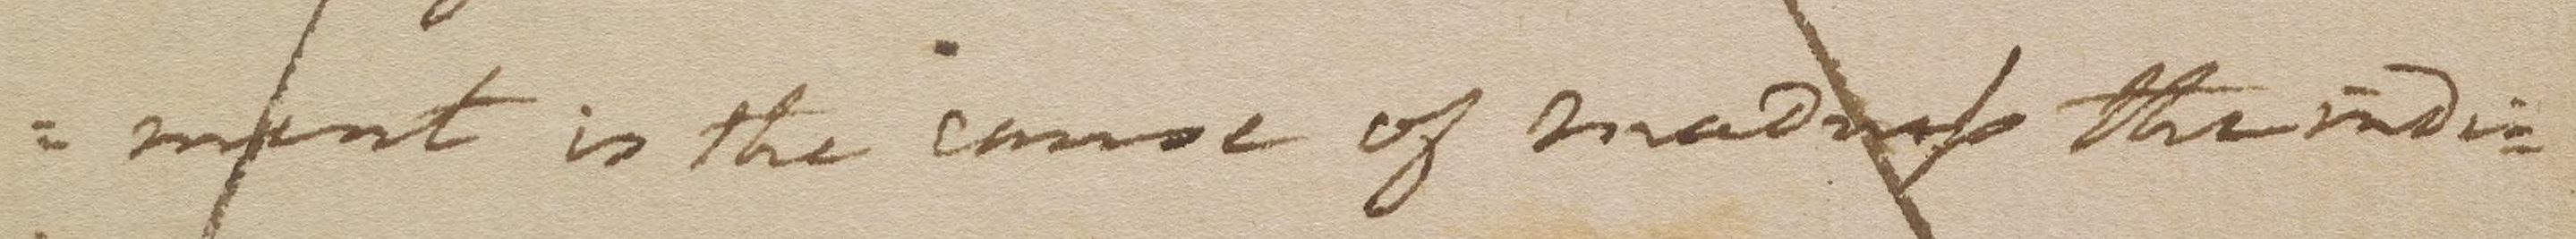-ment is the cause of madness the indi-
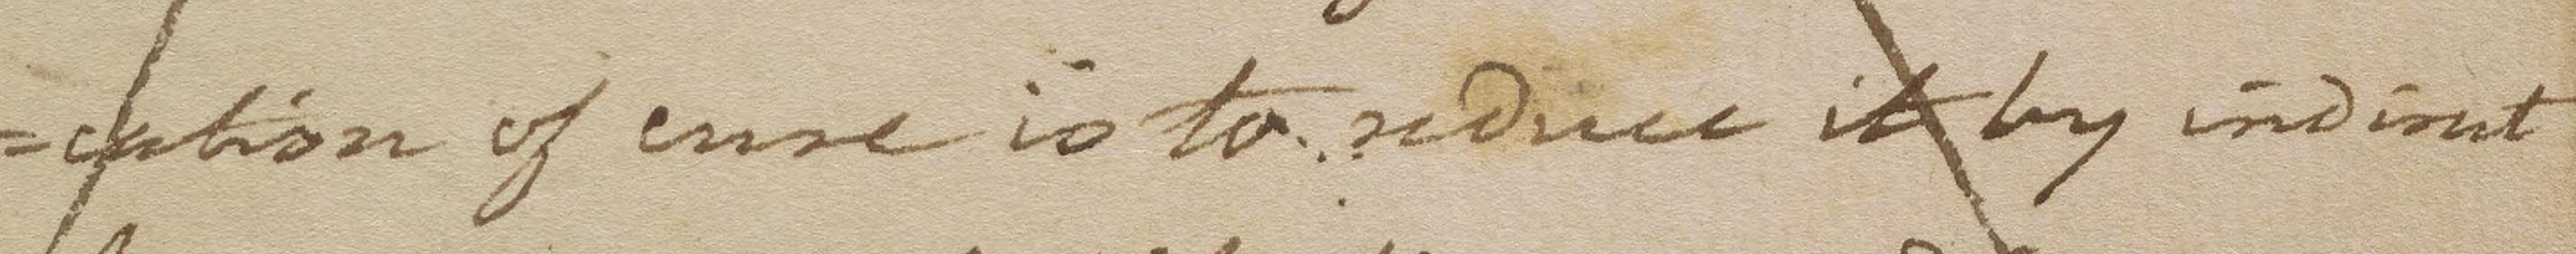cation of cure is to reduce it by incident
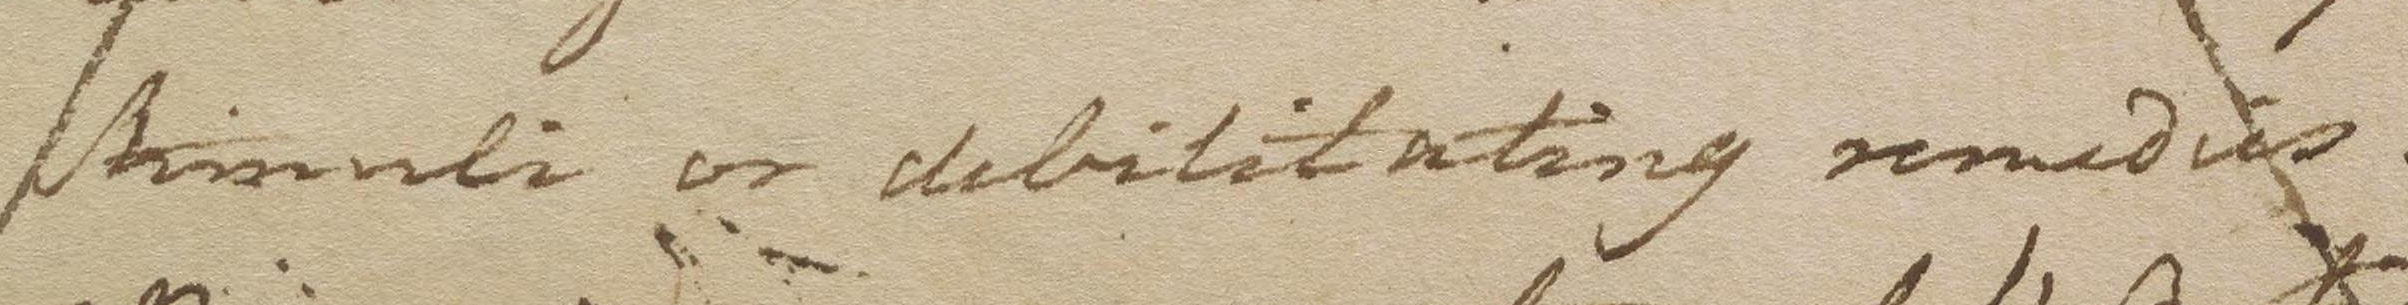stimuli or debilitating remedies.
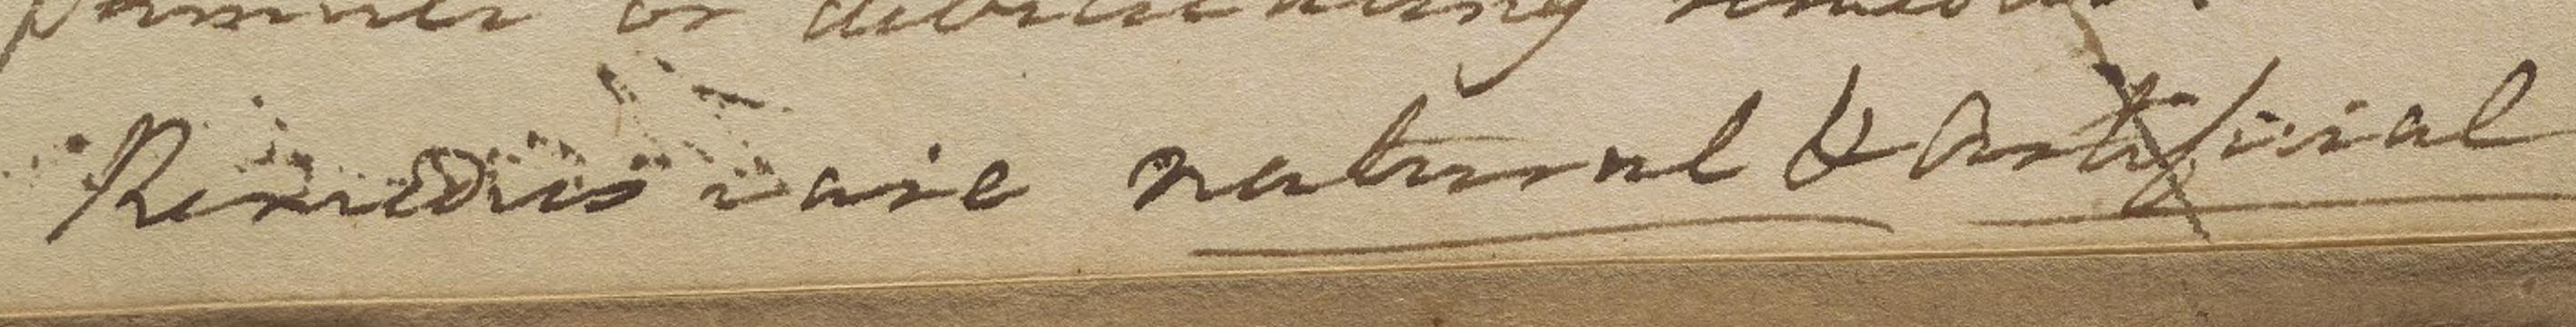Remedies are natural & artificial
